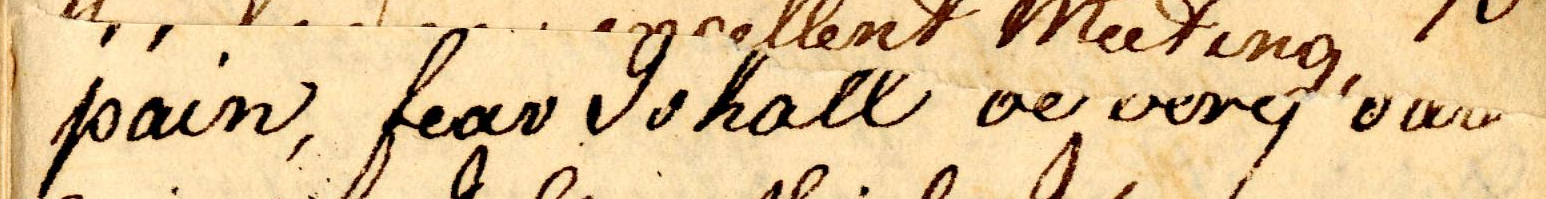pain, fear I shall be very [___]
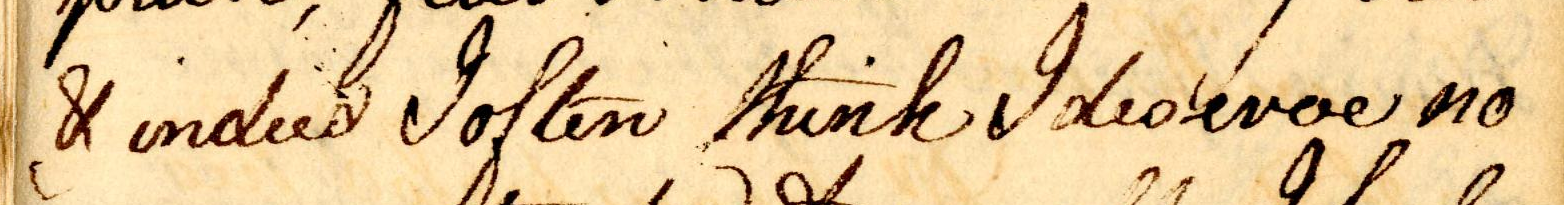& indeed I often think I deserve no
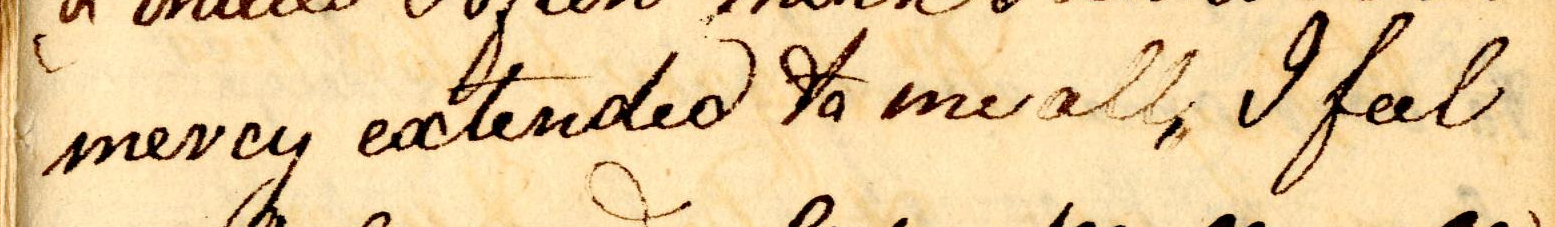mercy extended to me all I feel
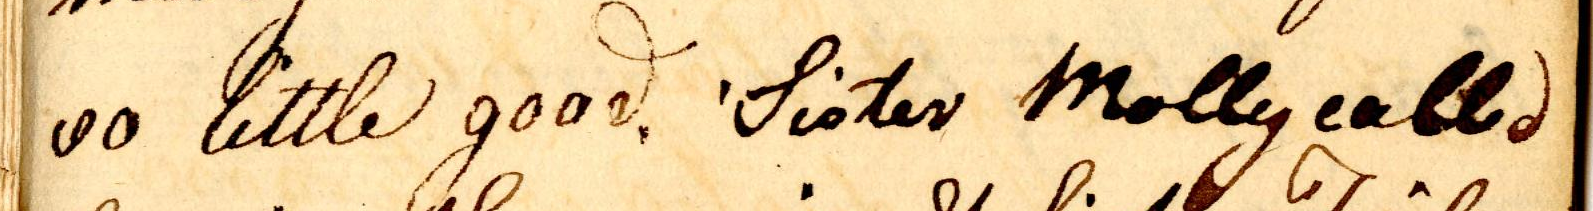so little good, Sister Molly called
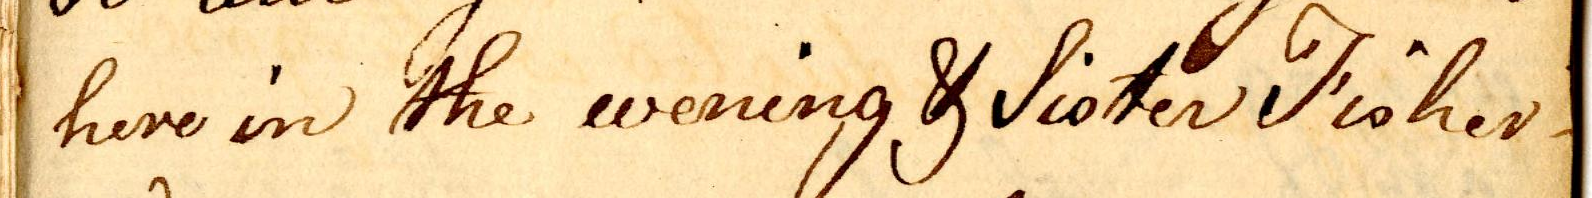here in the evening & Sister Fisher
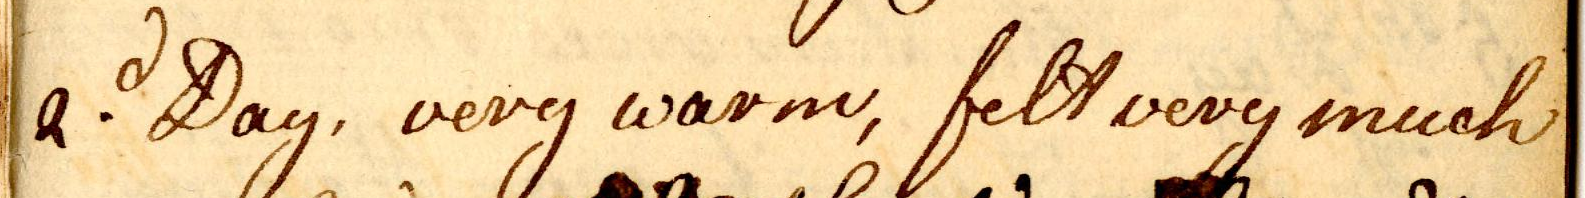2^d. Day, very warm, felt very much
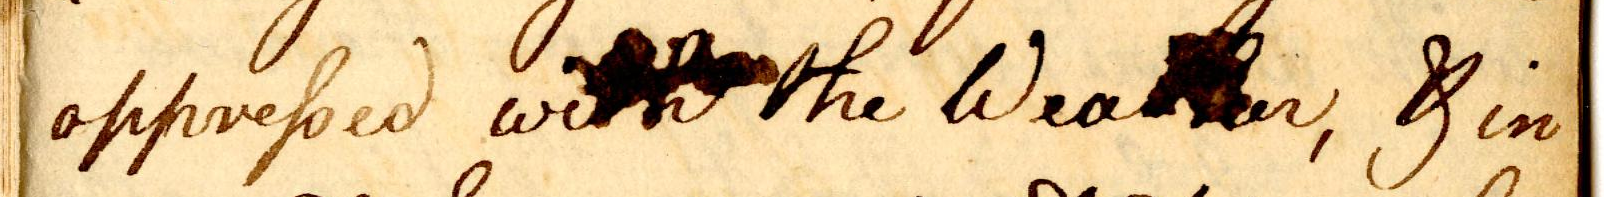oppressed with the Weather, & in
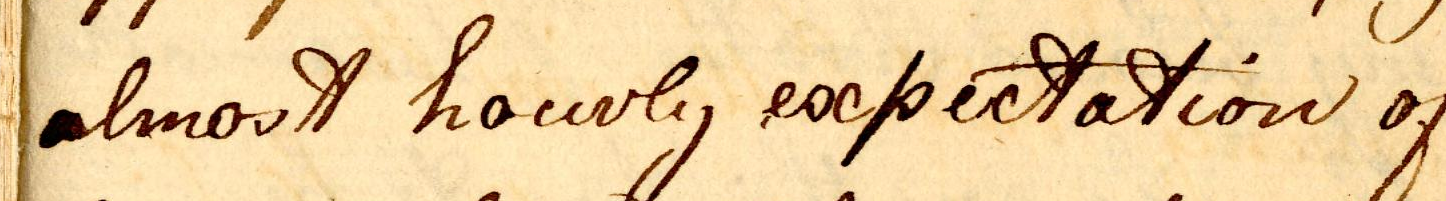almost hourly expectation of
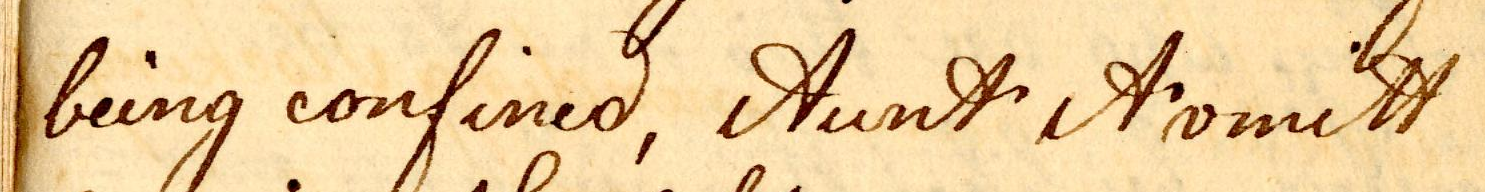being confined, Aunt Armitt
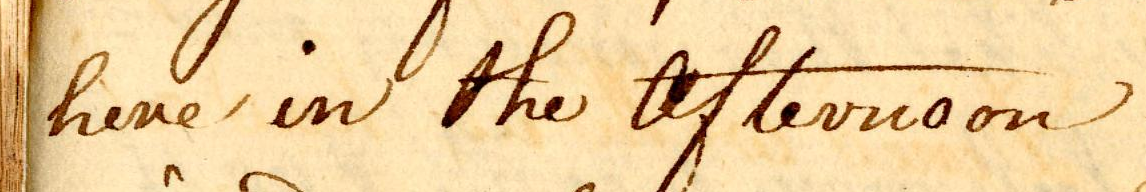here in the Afternoon
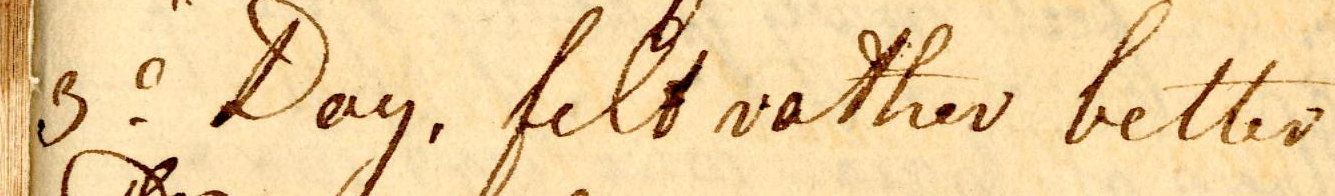3^d. Day, felt rather better
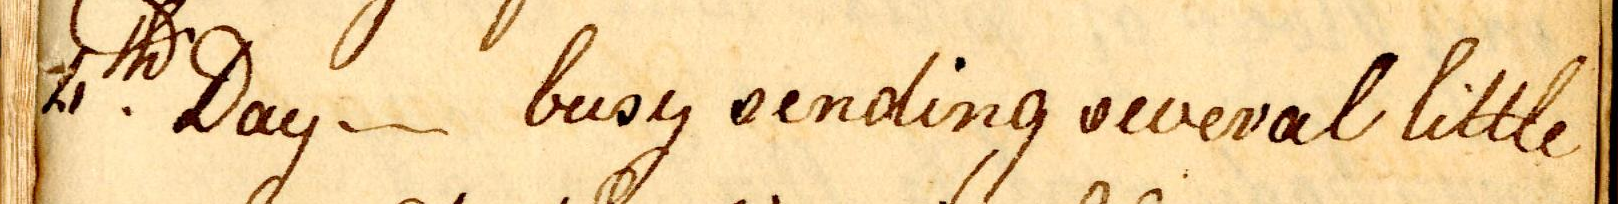4^th Day- busy sending several little
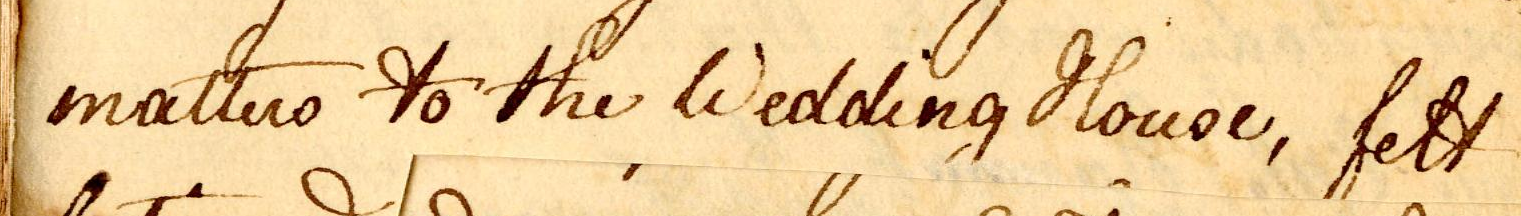matters to the Wedding House, felt
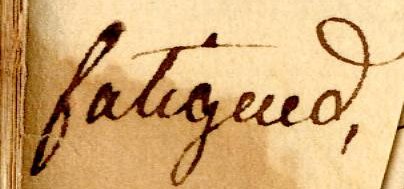fatigued,
